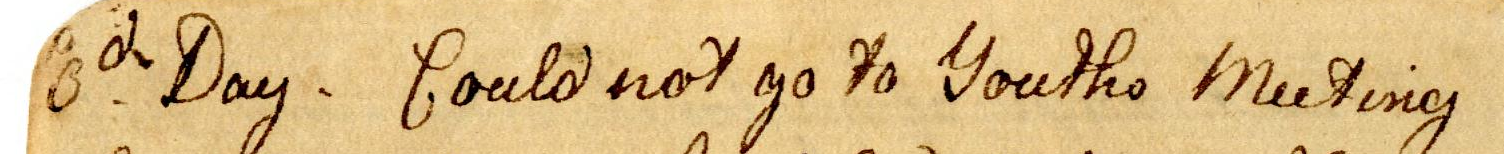3^d Day- Could not go to Youths Meting
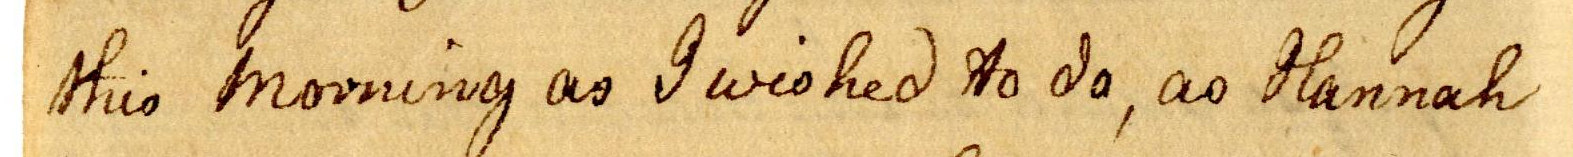this morning as I wished to do, as Hannah
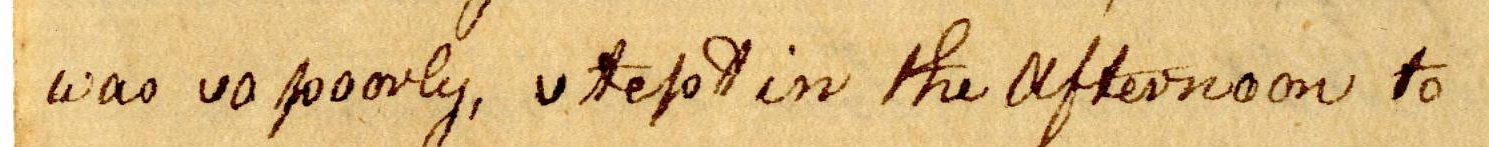was so poorly, stept in the Afternoon to
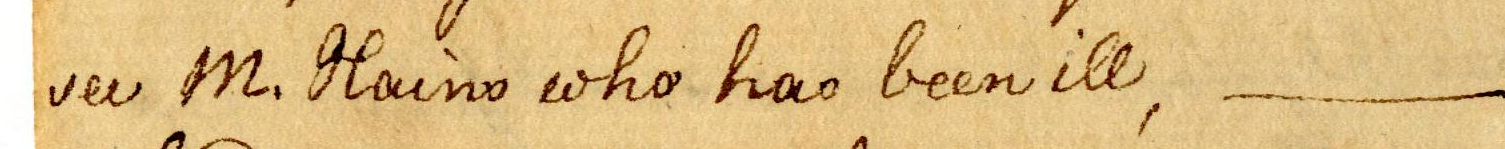see M. Hains who has been ill,-
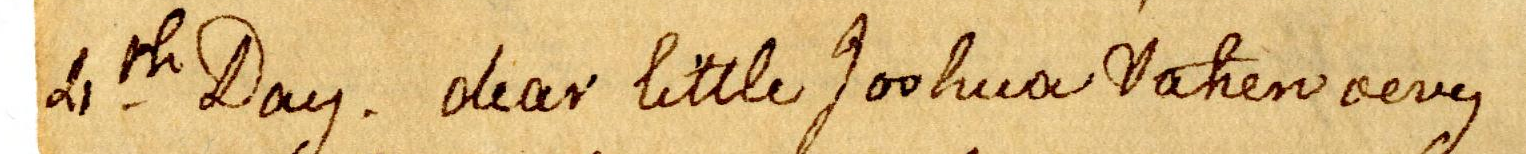4^th Day, dear little Joshua taken very
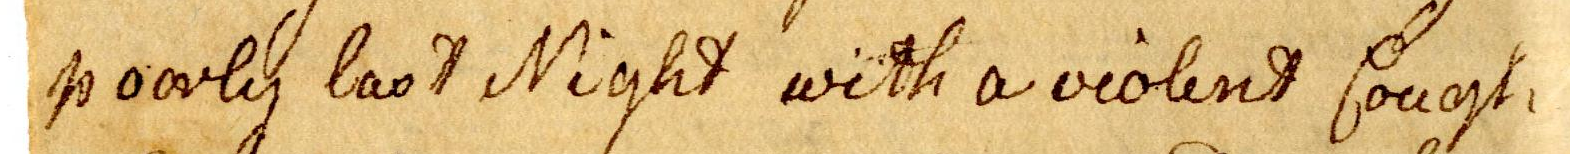poorly last Night with a violent Cough
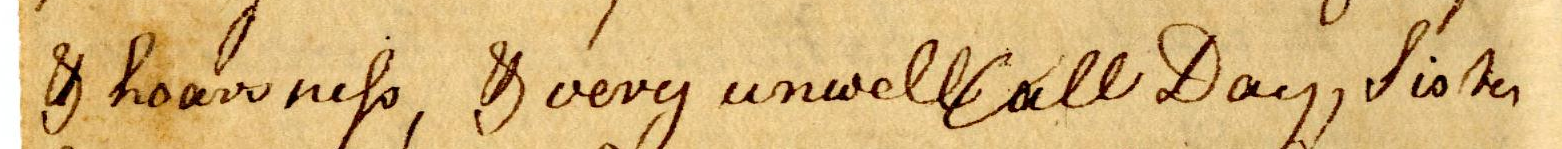& hoarsness, & very unwell (all Day, Sister
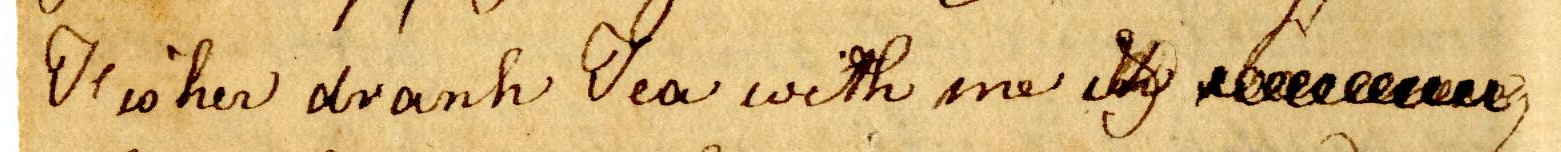Fisher drank Tea with me & [_________]
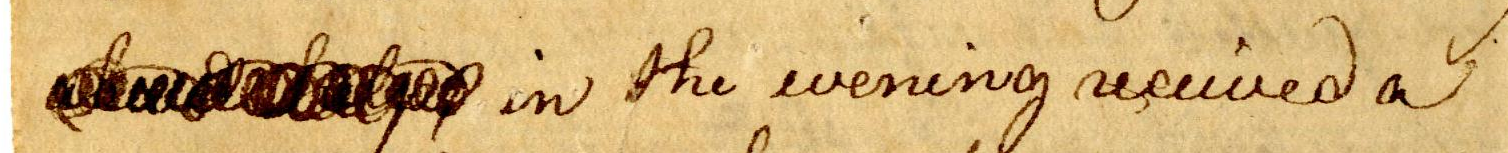[_________] in the evening received a
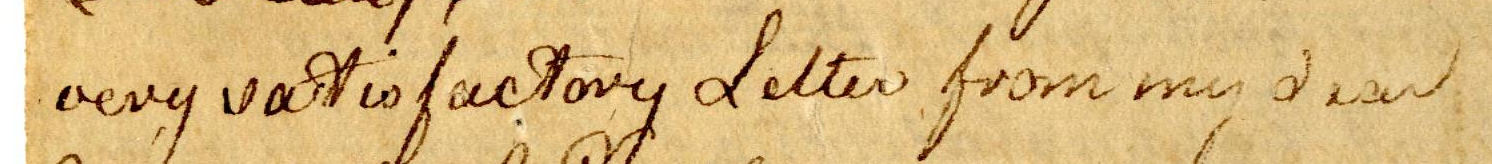very satisfactory Letter from my dear
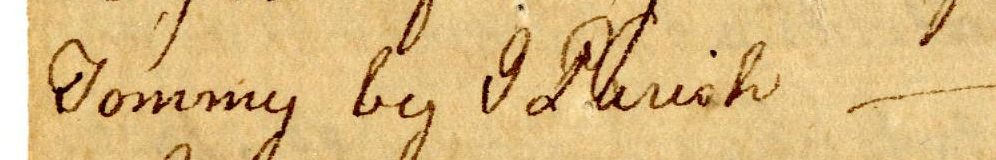Tommy by I Parish-
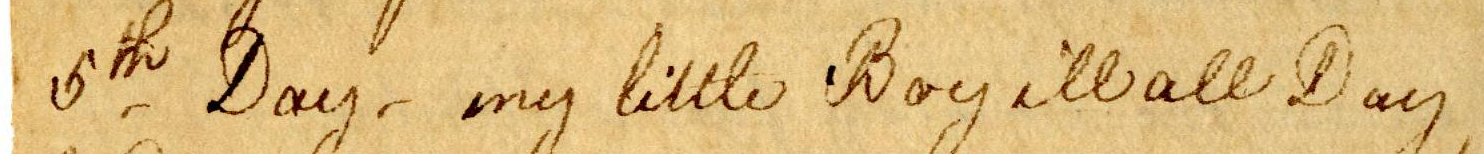5^th Day- my little Boy ill all Day
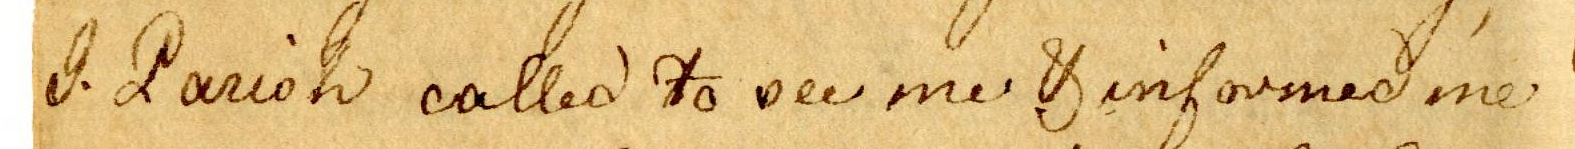I. Parish called to see me & informed me
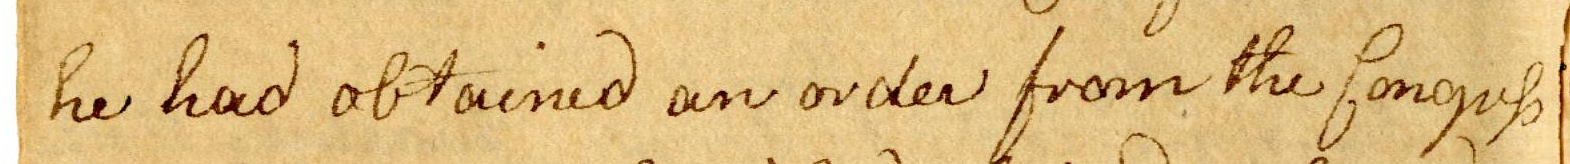he had obtained an order from the Congress
